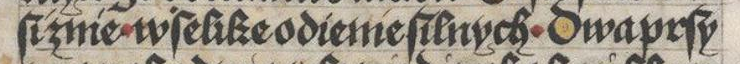ſí zníe.wẛelike odieníe ſilnych.Dwa prſy
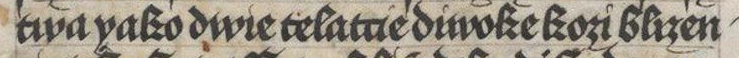twa yako dwie telatcie diwoke kozi blizen¬
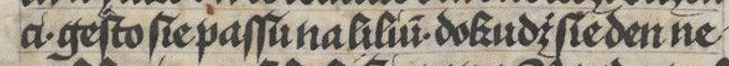ci.geẛto ſie paſſu na liliū.dokudż ſie den ne¬
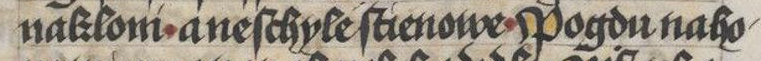nakloní.a neſchyle ſtienowe.Pogdu naho¬
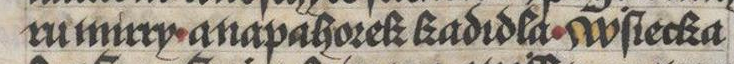ru mirry.a naparek kadidla.Wẛiecka
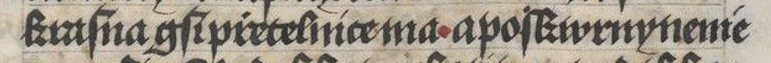kraſna gſi pṙetelníce ma.a poẛkwrnynenie
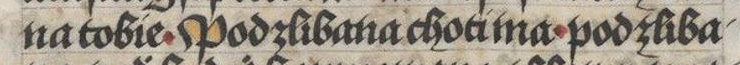na tobie.Pod zlibana choti ma.pod zliba¬
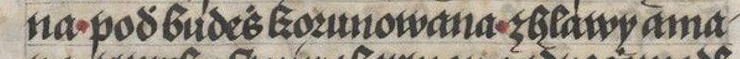na.poď budeṡ korunowana.zhlawy ama¬
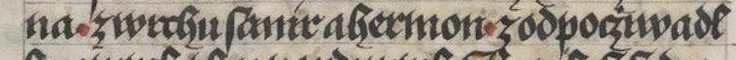na.zwrchu ſanír a hermon.zodpocżiwadladl
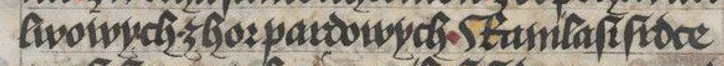lwowych.zhor pardowych.Ranilaſi ſrdce
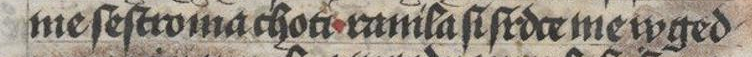me ſeſtro ma choti.ranila ſi ſrdce me wged¬
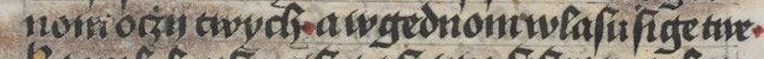nom ocżij twych.a wgednom wlaſu ẛige twe.
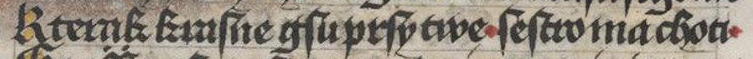Kterak kraſne gſu prſy twe.ſeſtro ma choti.
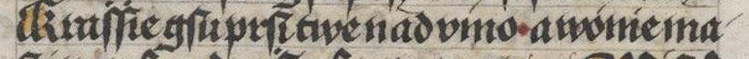Kraẛſie gſu prſi twe nad vino.a wónie ma¬
